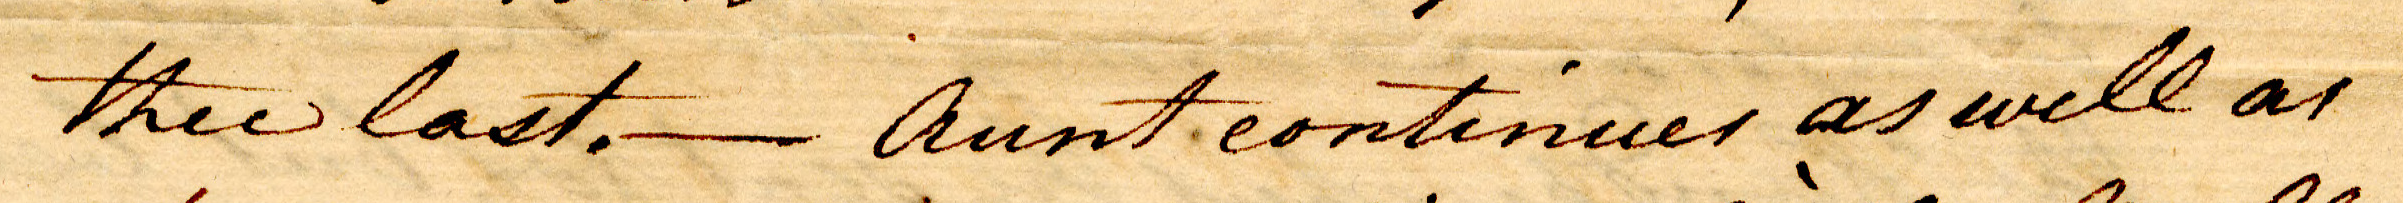thee last.- Aunt continues as well as
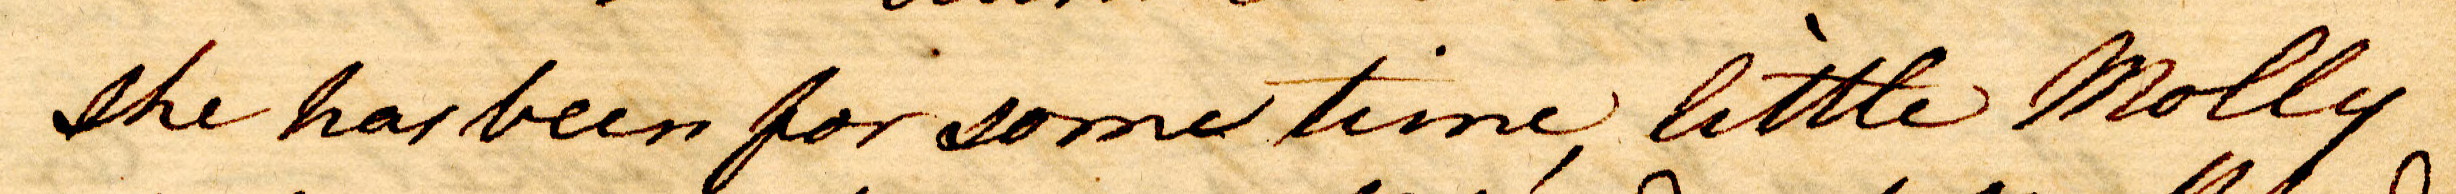she has been for some time, little Molly
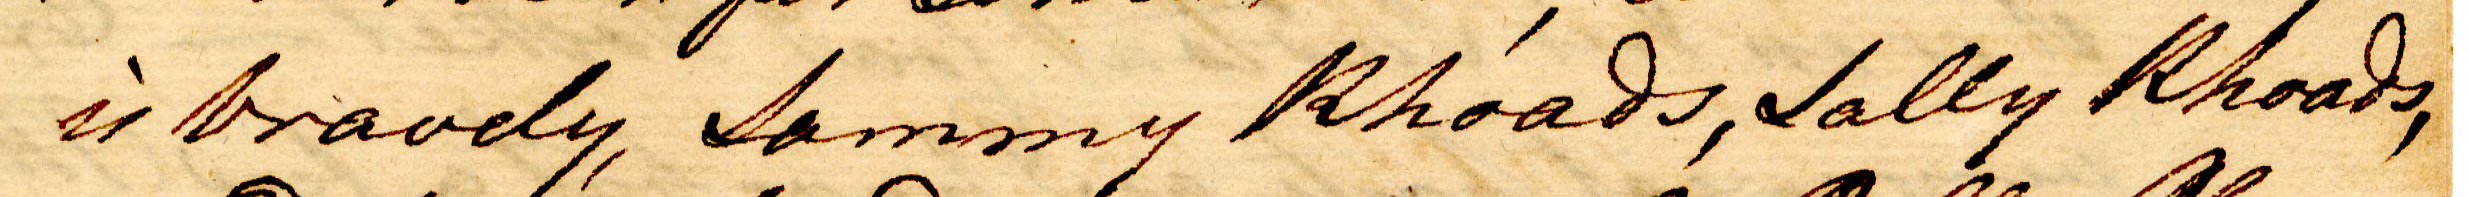is bravely, Sammy Rhoads, Sally Rhoads,
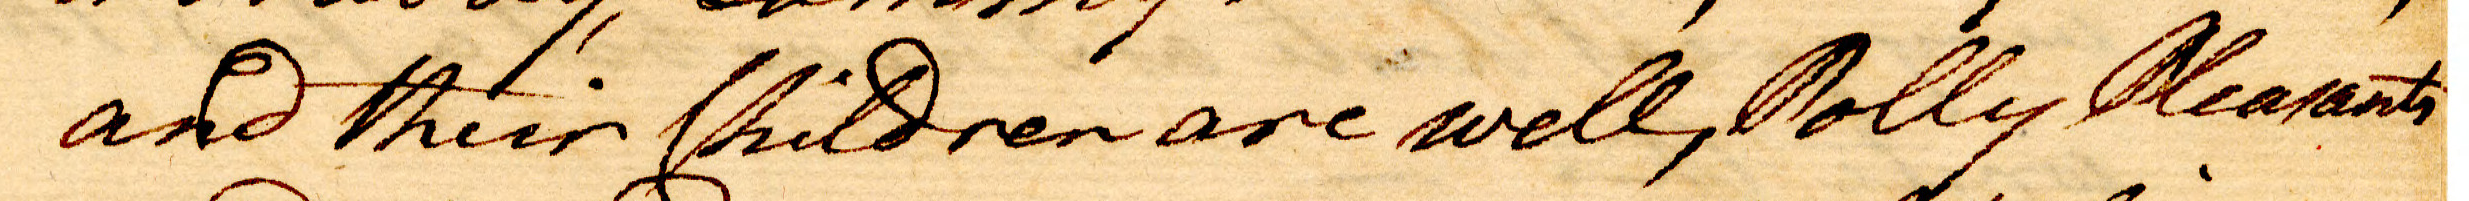and their Children are well, Polly Pleasants
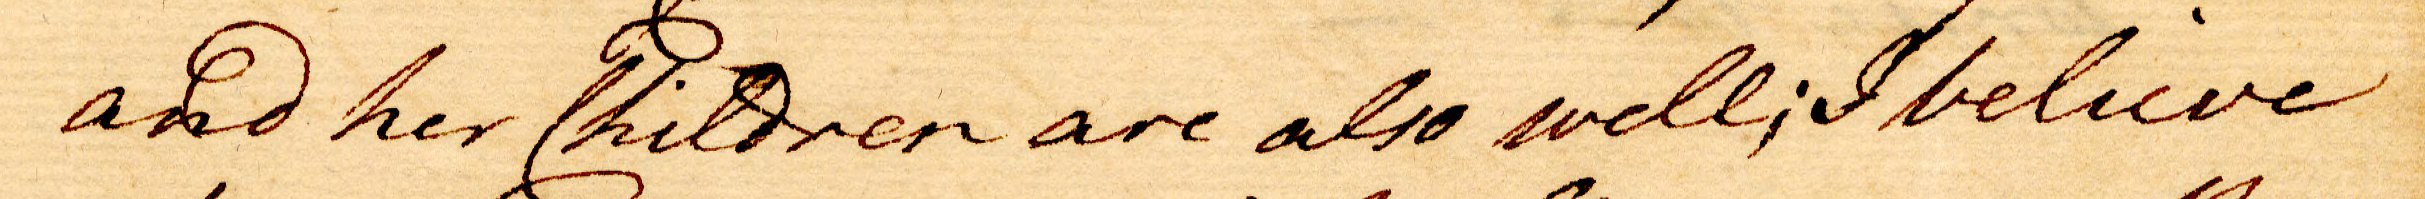and her Children are also well; I believe
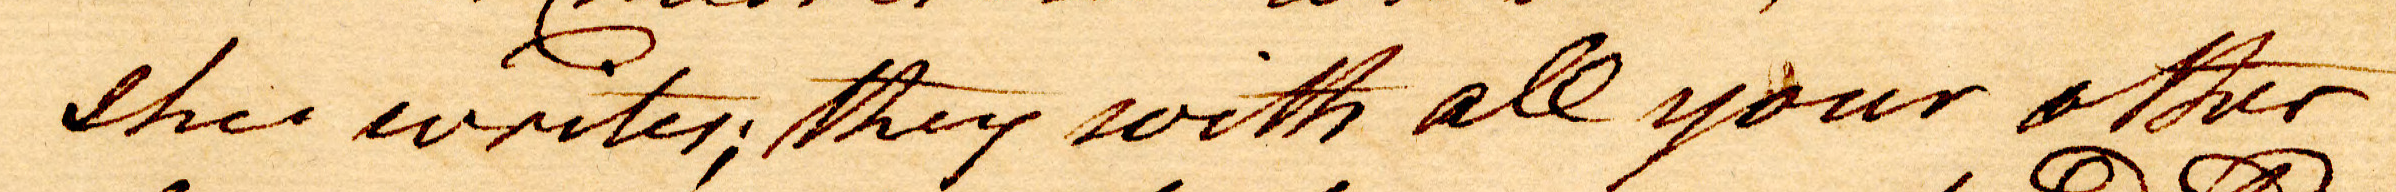she writes; they with all your other
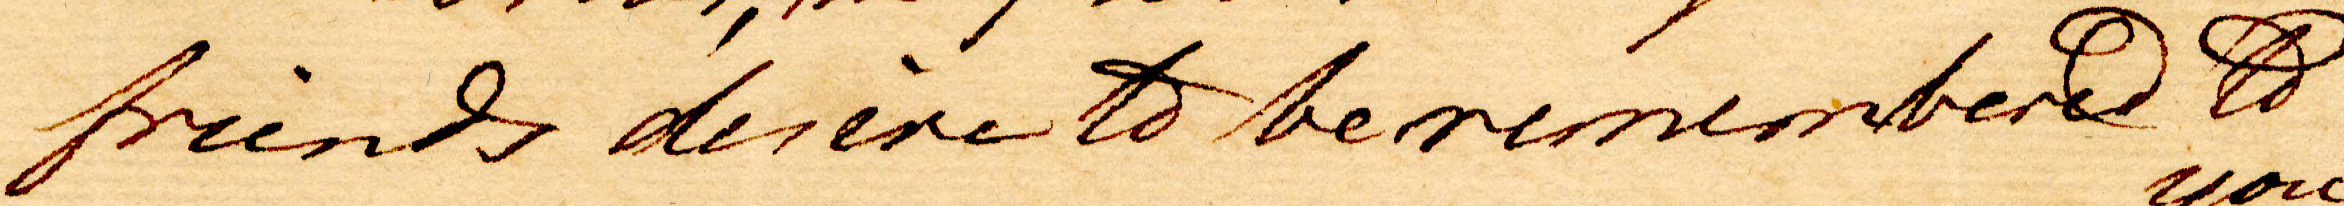friends desire to be remembered to
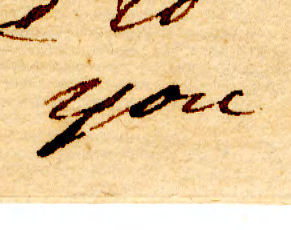you
